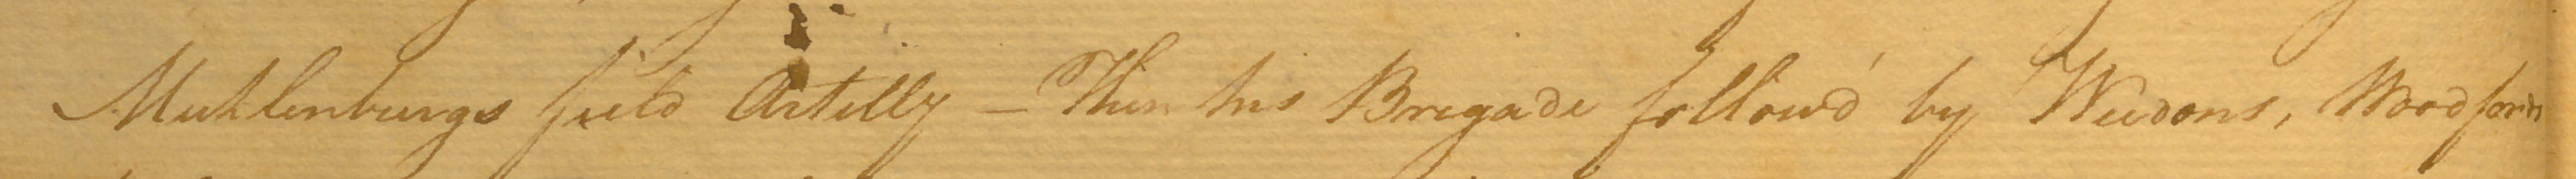Muhlenburgs field Artilly- Then his Brigade follow'd by Weedons, Woodfords
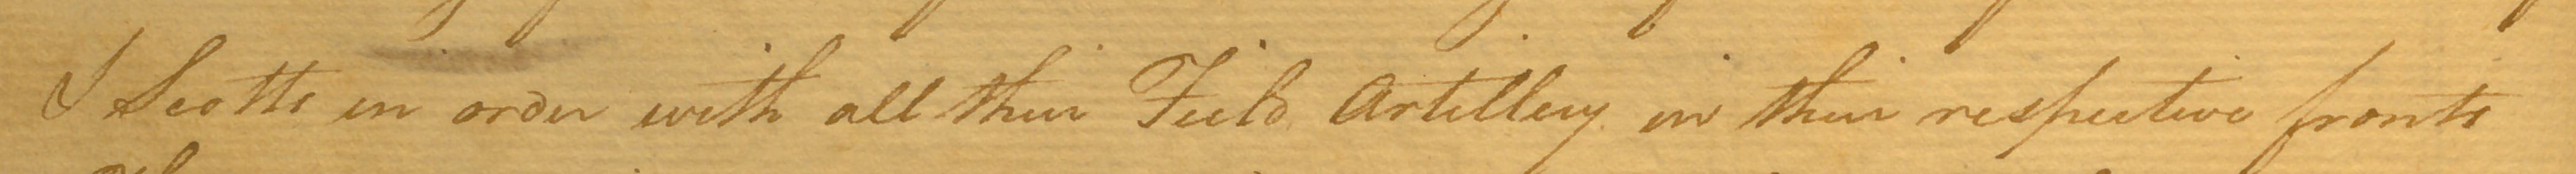& Scotts in order with all their Field Artillery in their respective fronts
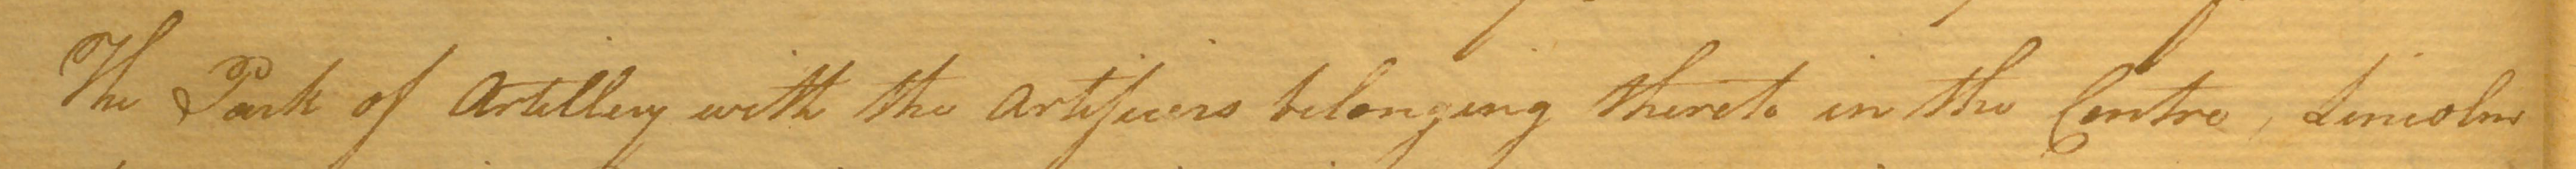The Park of Artillery with the Artificers belonging thereto in the Centre, Lincolns
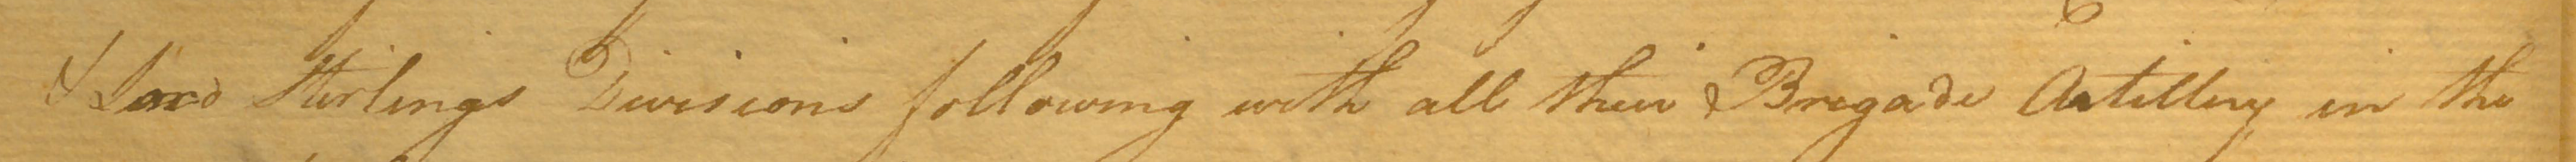& Lord Stirlings Divisions following with all their Brigade Artillery in the
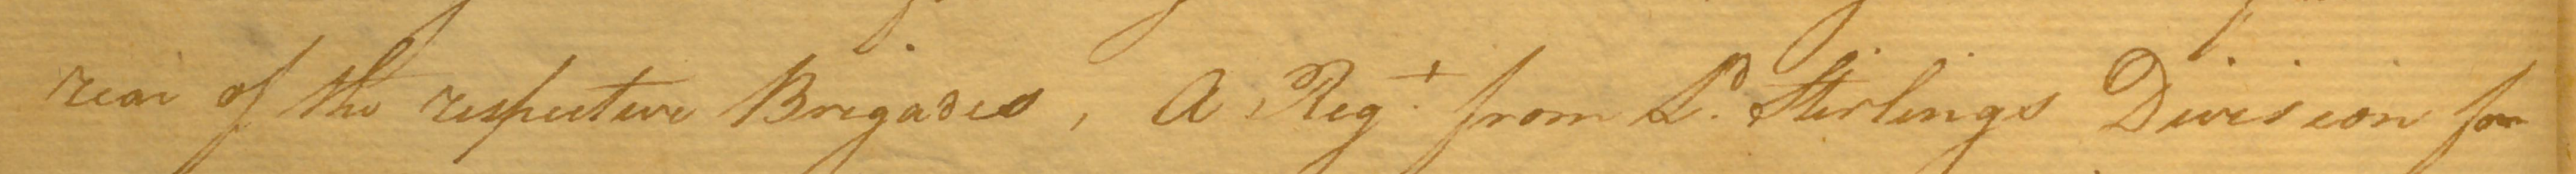rear of the respective Brigades, A Reg^t. from L^d. Stirlings Division for
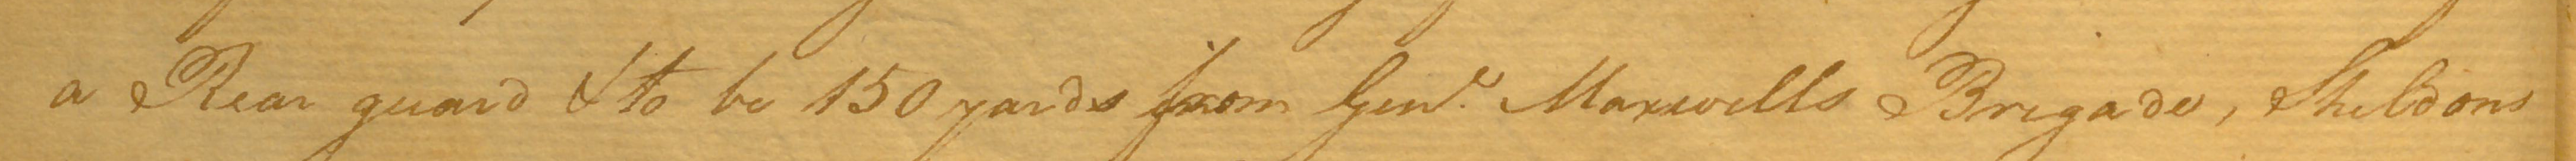a Rear guard & to be 150 yards from Gen^l. Maxwells Brigade, Sheldons
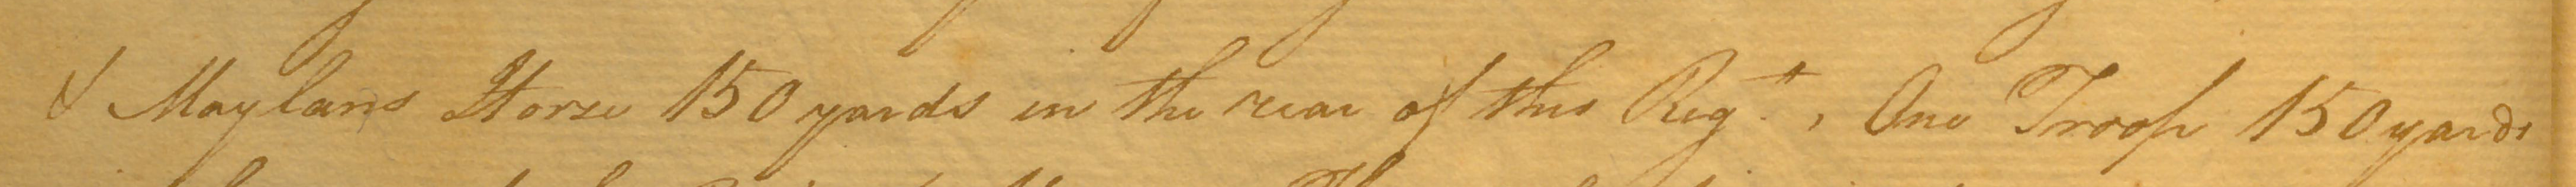& Maylans Horse 150 yards in the rear of this Reg^t., One Troop 150 yards
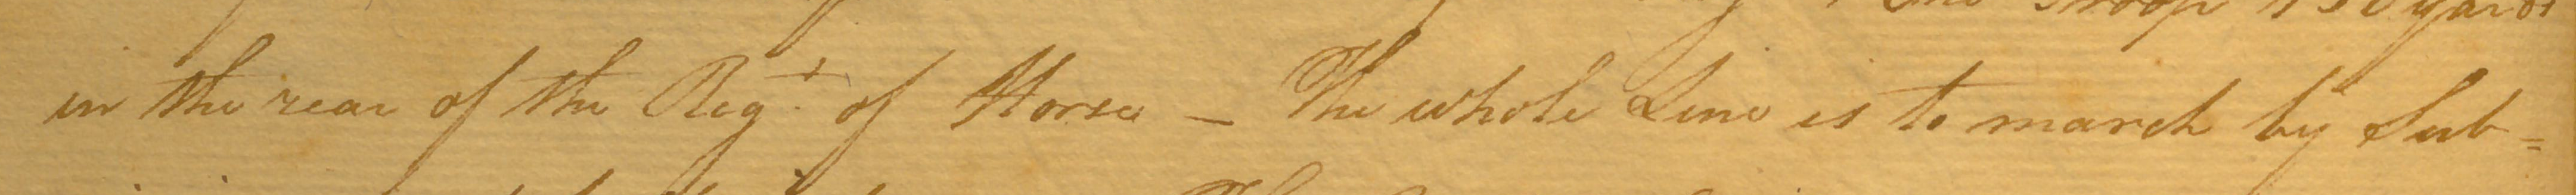in the rear of the Reg^t. of Horses- The whole Line is to march by Sub-
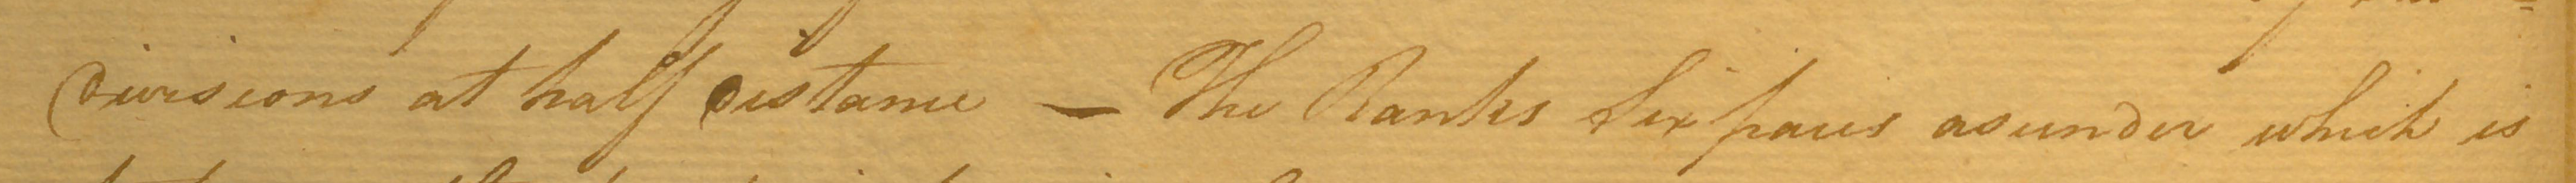divisions at half distance- The Ranks Six paces asunder which is
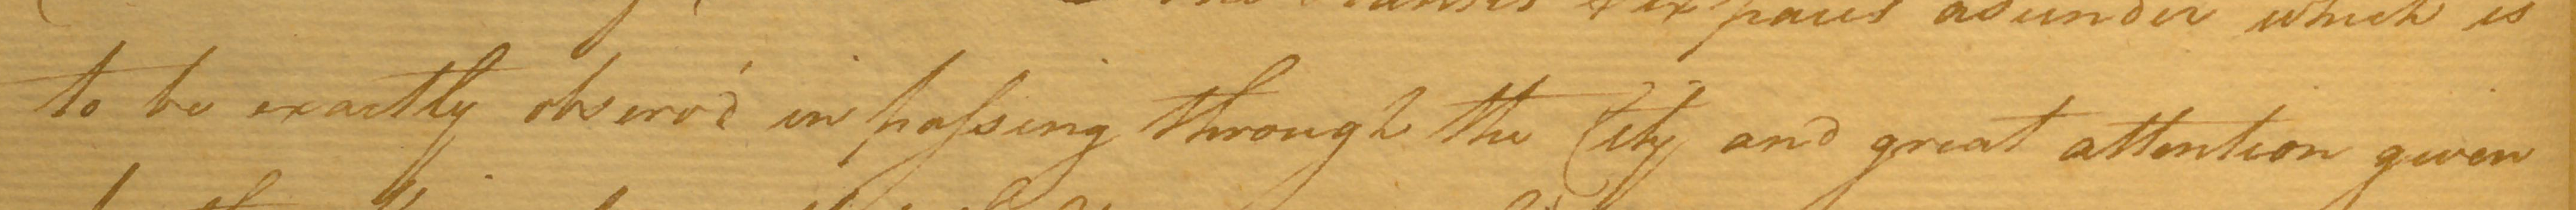to be exactly observ'd in passing through the City and great attention given
